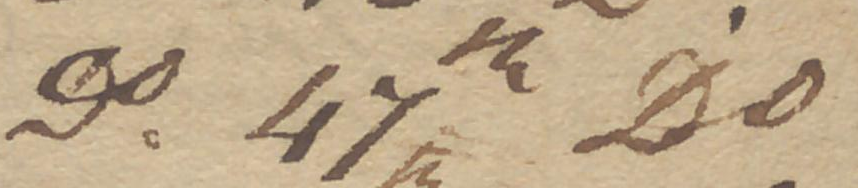D^o. 47^th. D^o
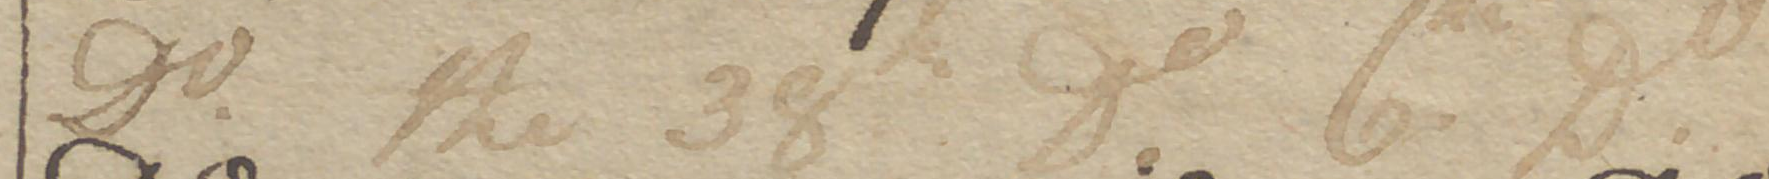D^o. the 38^th D^o. 6^th. D^o.
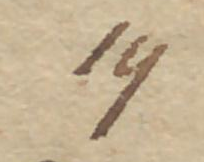19
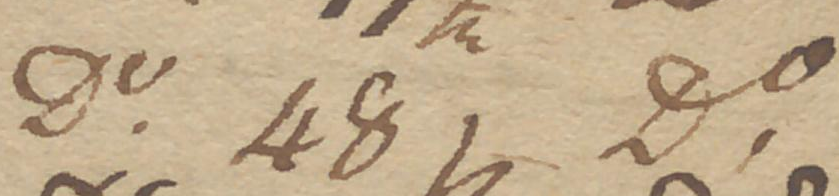D^o. 48^th D^o.
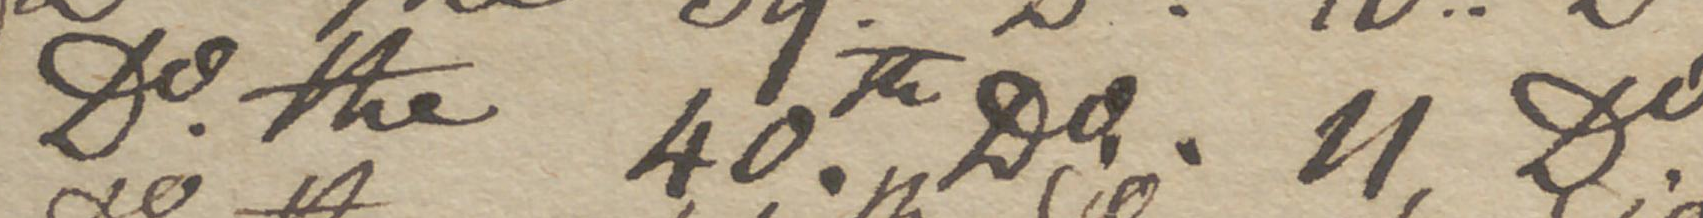D^r. the 48^th D^o. 11 D^o.
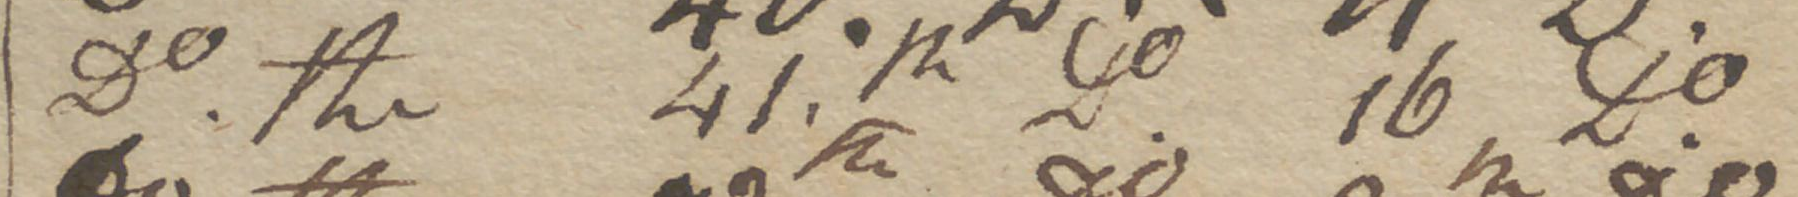D^o. the 41^th. D^o. 16 D^o.
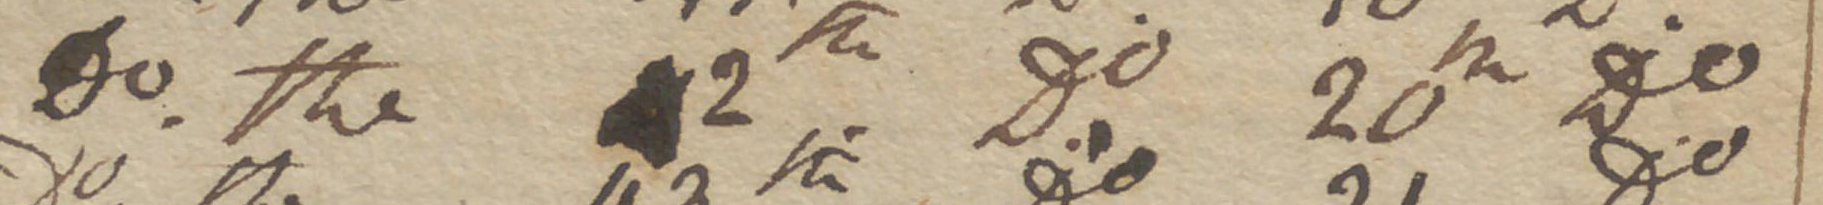D^o. the [4]2^th D^o. 20^th D^o.
